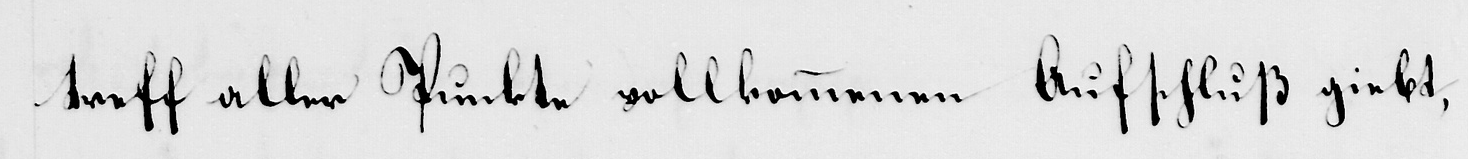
treff aller Punkte vollkommenen Aufschluß giebt,
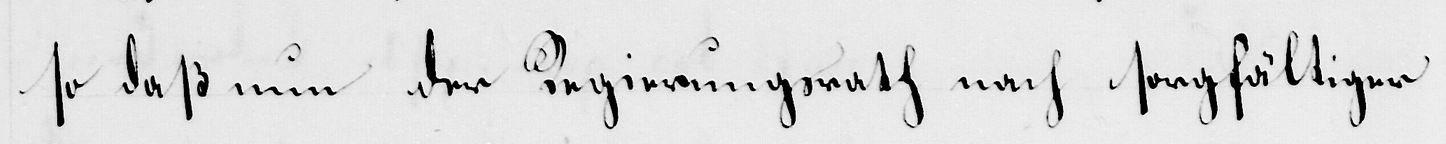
so daß nun der Regierungsrath nach sorgfältiger
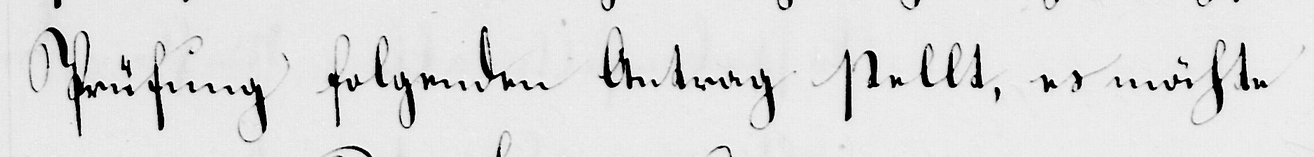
Prüfung folgenden Antrag stellt, es möchte
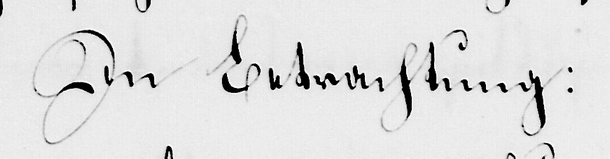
In Betrachtung:
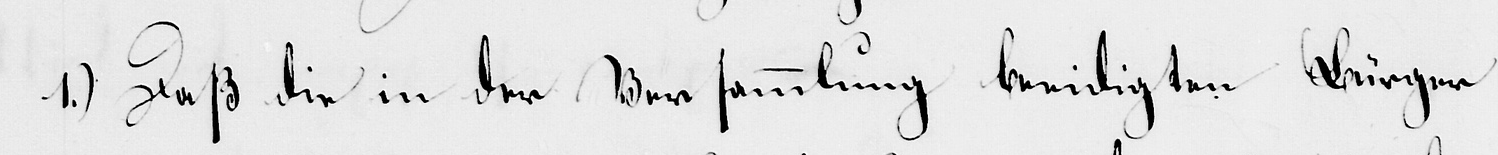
1.) Daß die in der Versammlung beeidigten Bürger
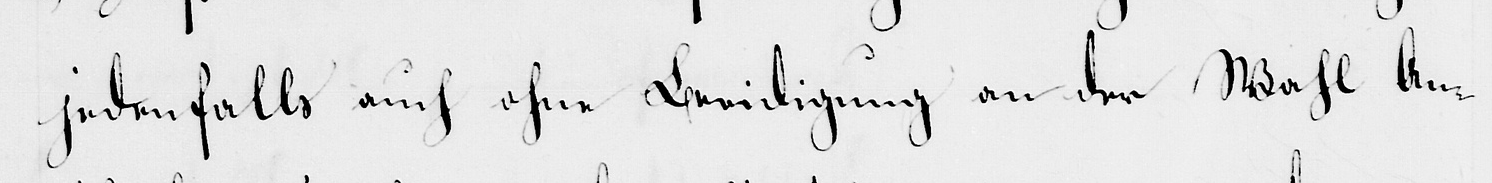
jedenfalls auch ohne Beeidigung an der Wahl An¬
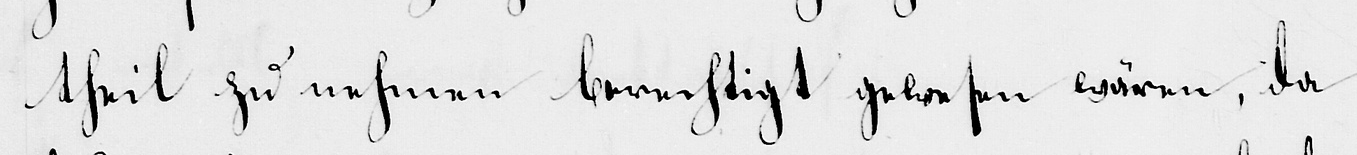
theil zu nehmen berechtigt gewesen wären, da
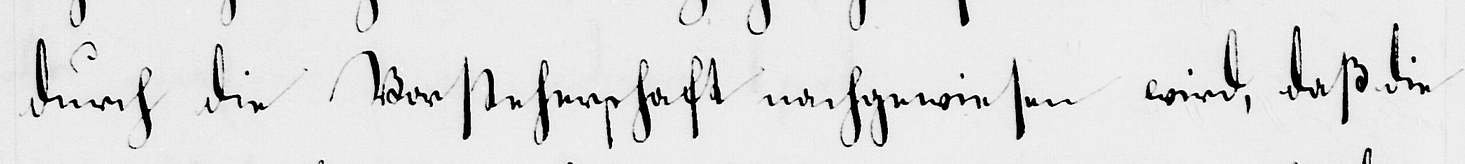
durch die Vorsteherschaft nachgewiesen wird, daß die
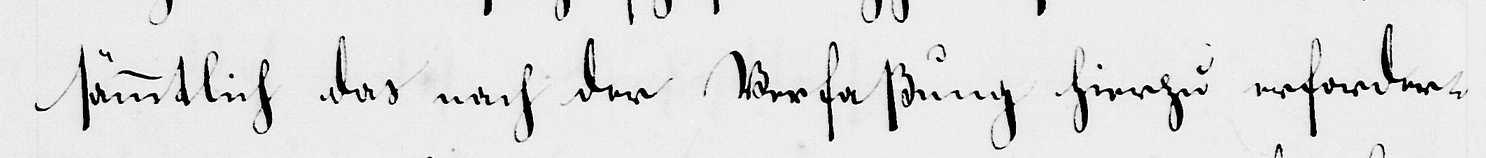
sämmtlich das nach der Verfaßung hierzu erforder¬
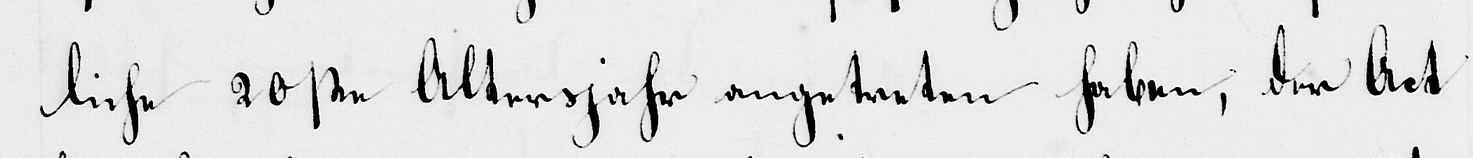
liche 20ste Altersjahr angetreten haben, der Act
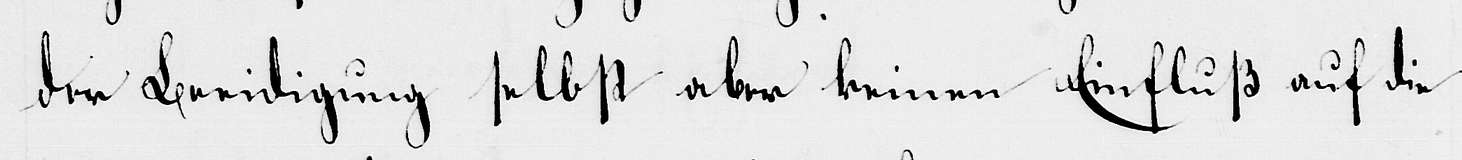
der Beeidigung selbst aber keinen Einfluß auf die
